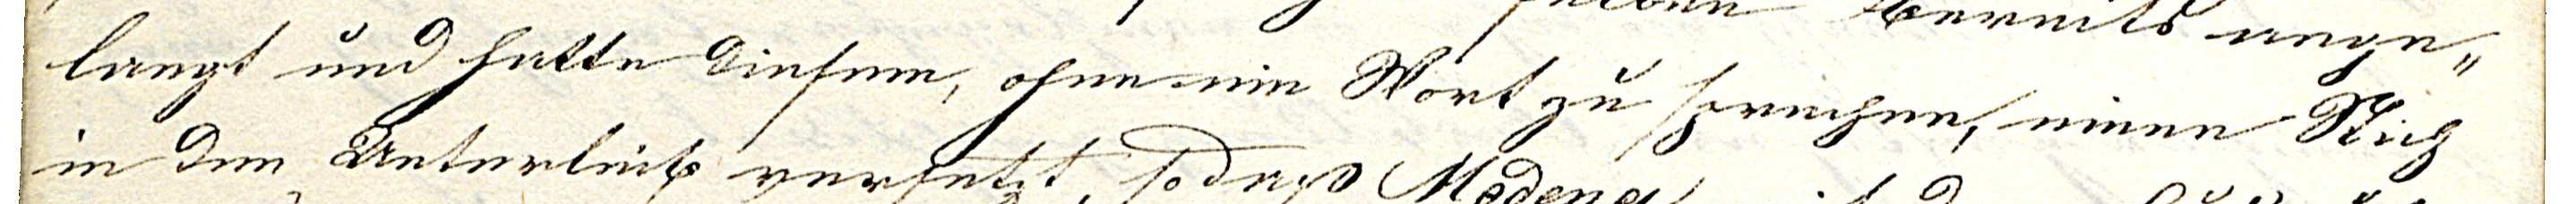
langt und hatte diesem, ohne ein Wort zu sprechen, einen Stich
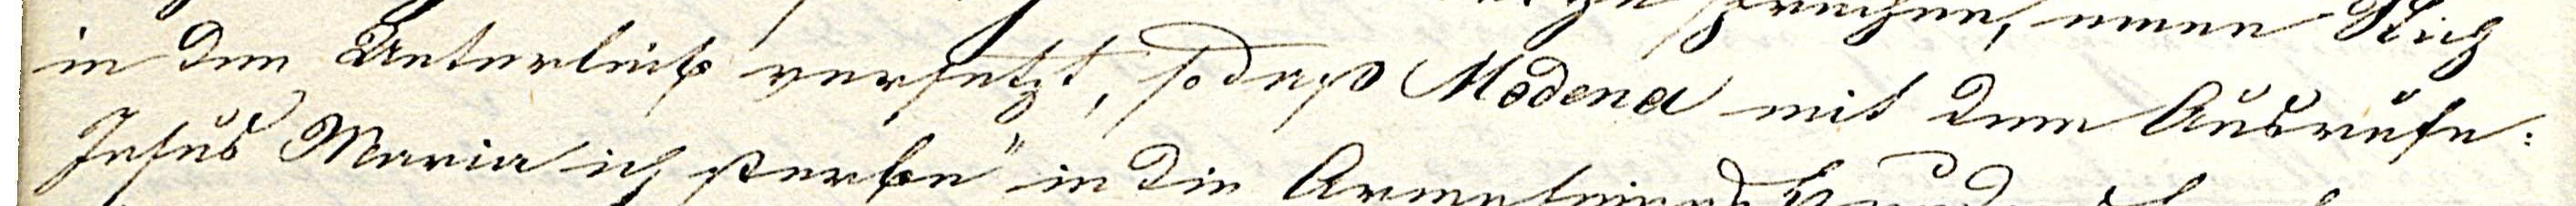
in den Unterlieb versetzt, so daß Modena mit dem Ausrufe:
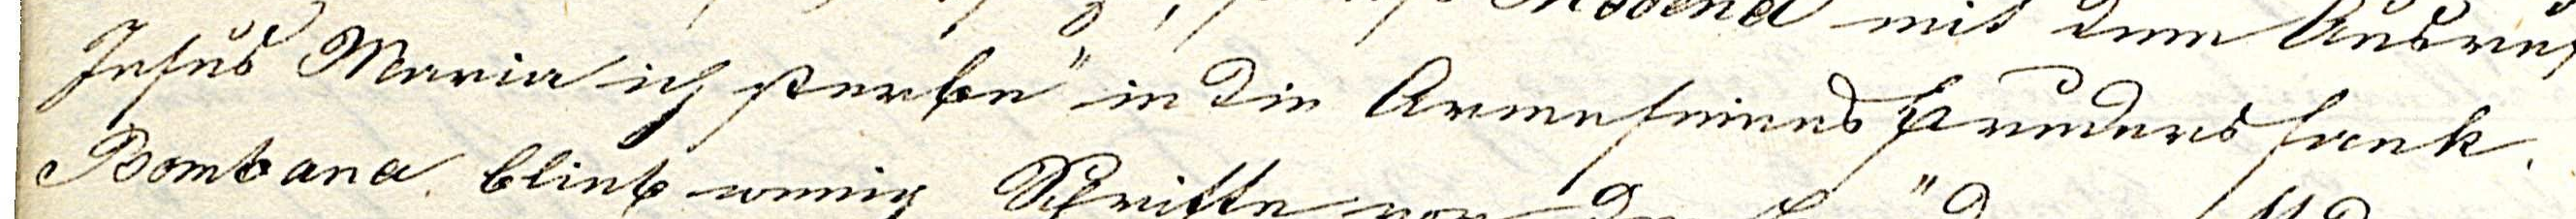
Jesus Maria ich sterbe" in die Arme seines Brudersfank.
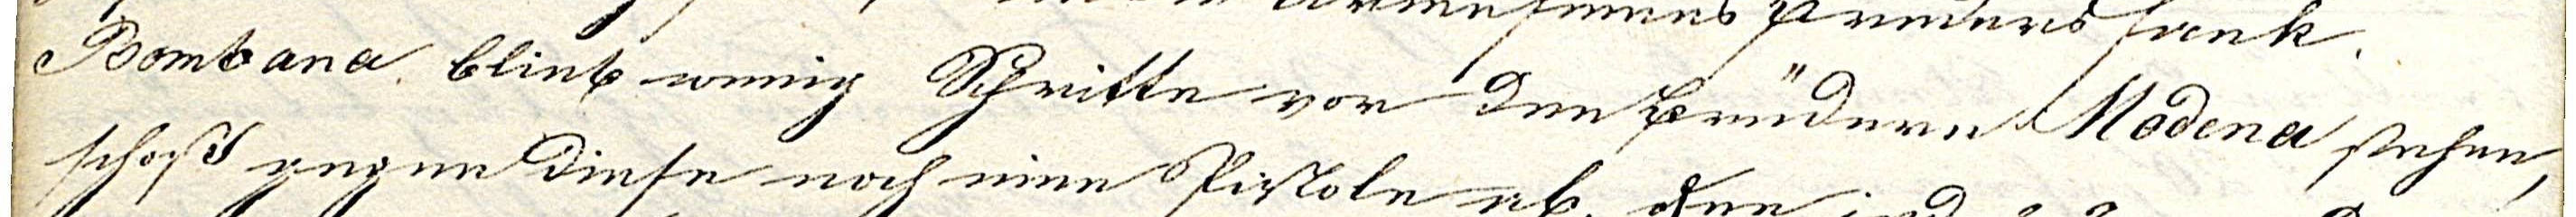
Bombana blieb wenig Schritte vor den Brüdern Modena stehen,
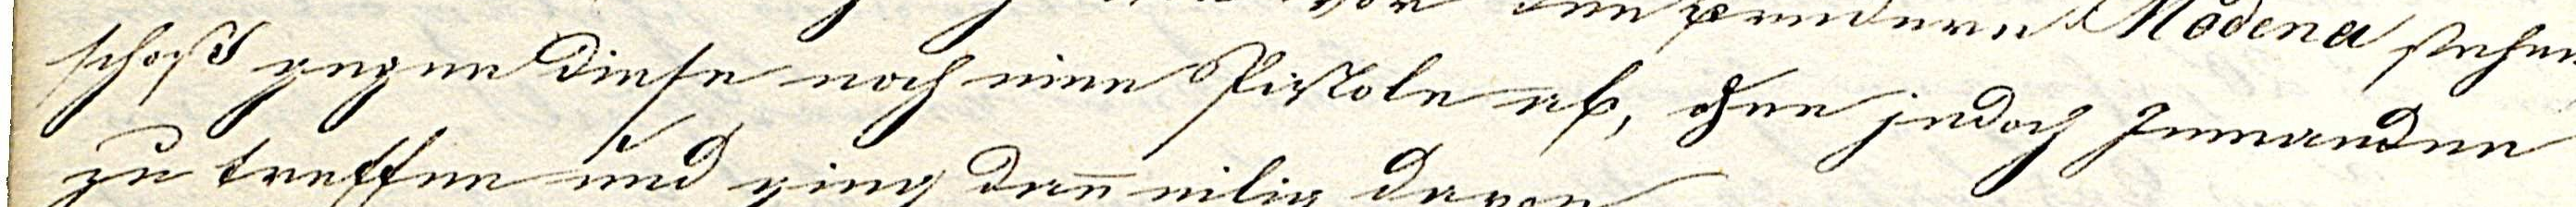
schloß gegen diese noch eine Pistole ab, ohne jedoch Jemanden
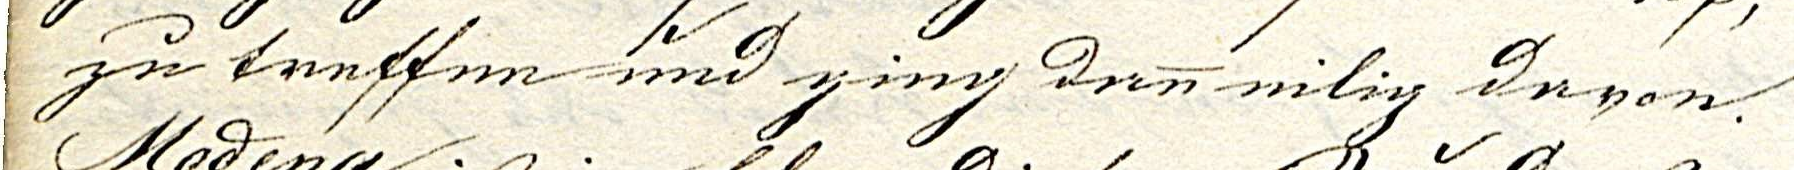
zu treffen und ging dann eilig davon.
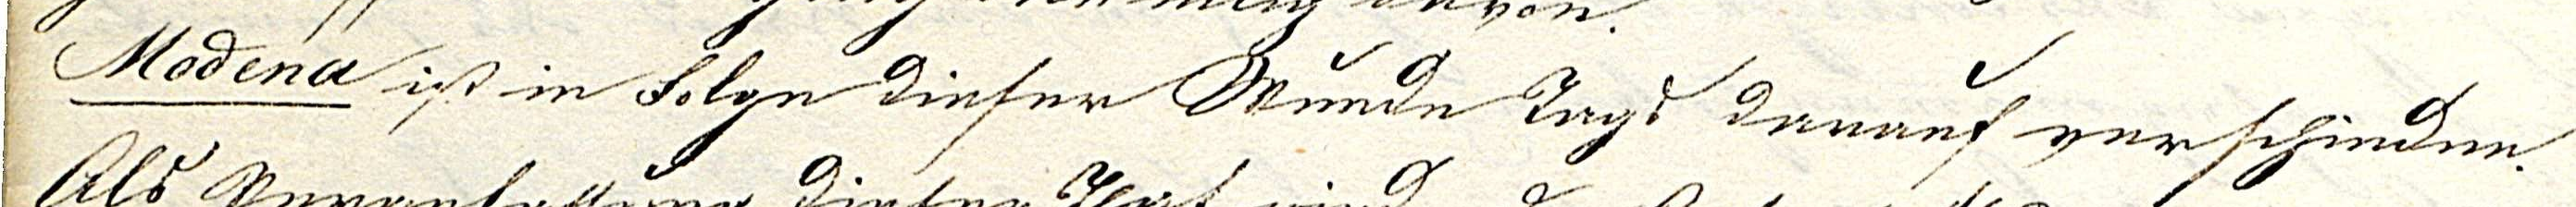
Modena ist in Folge dieser Wunde Tagd darauf verschieden.
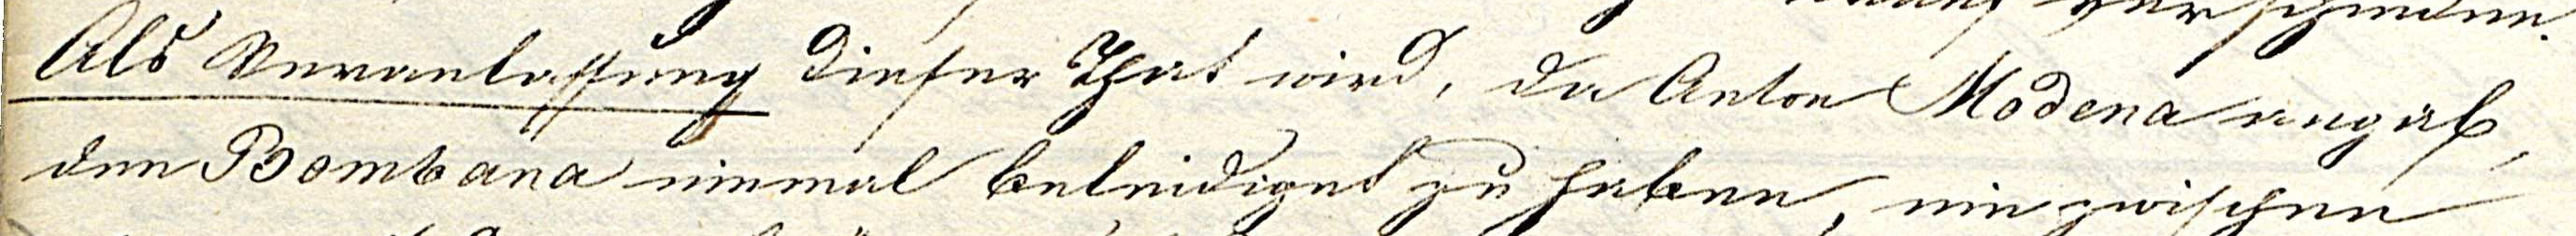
Als Veranlassung dieser That wird, da Anton Modena angab,
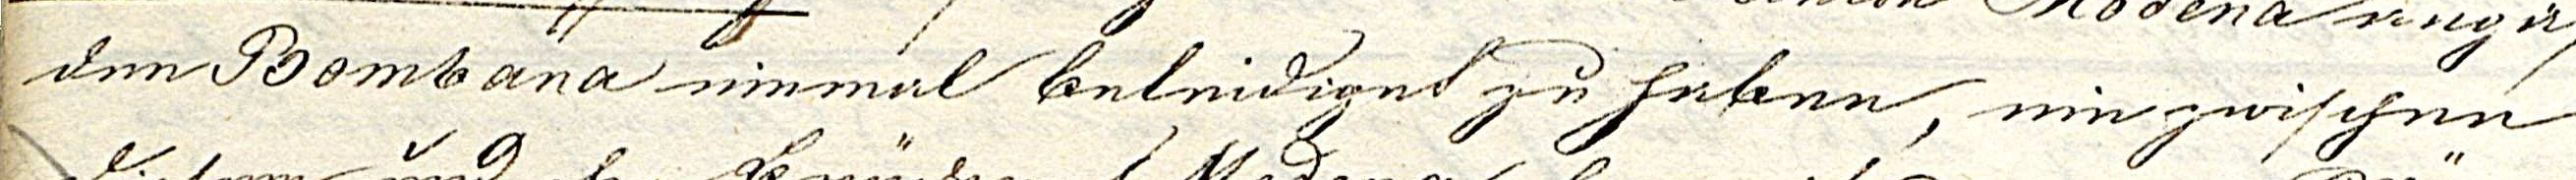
dem Bombana einmal belnidigel zu heben, ein zwischen
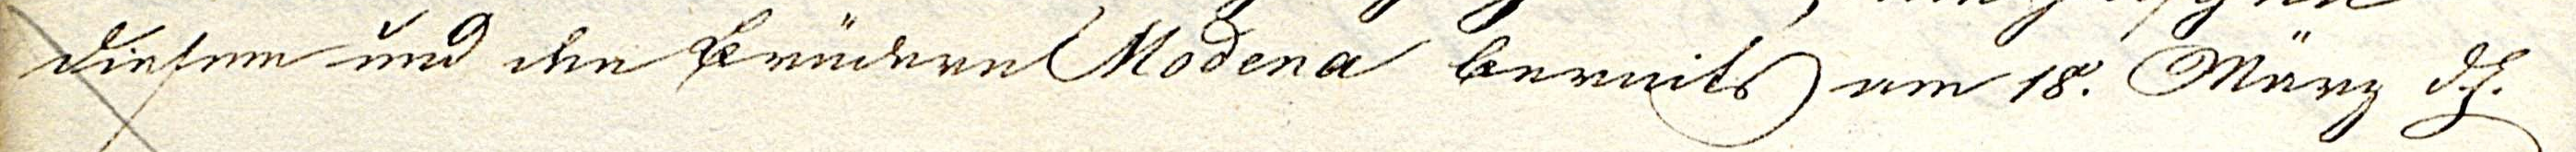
diesem und den Brüdern Modena bereits am 18. März d. h.
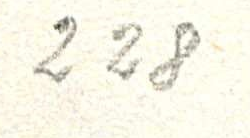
228
